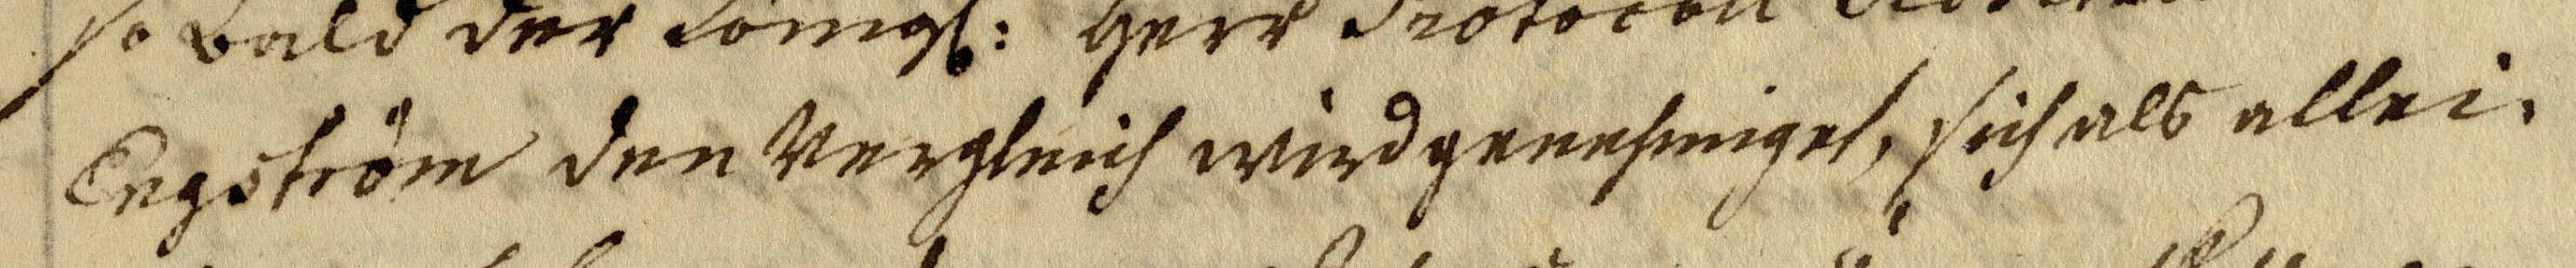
Engström den Vergleich wird genehmiget, sich als allei¬
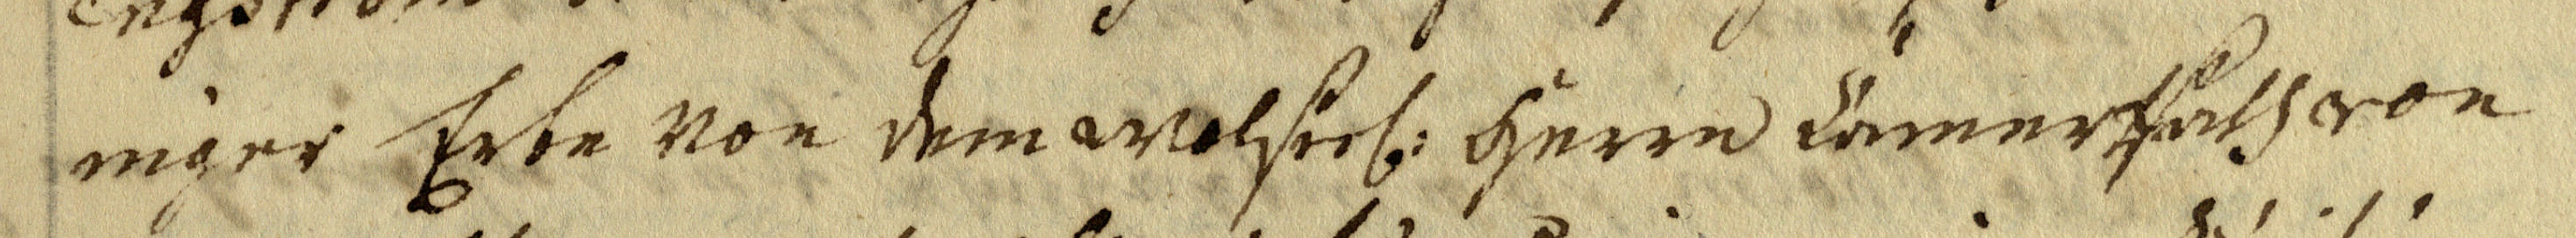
niger Erbe von dem wolseel. Herrn CammerRath von
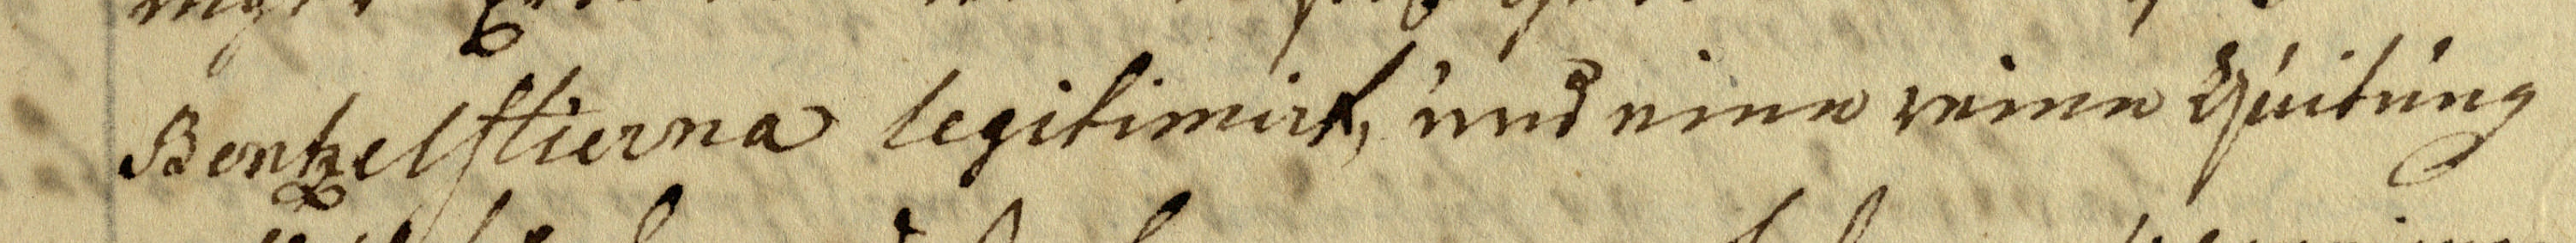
Bentzelstierna legitimirt, und und eine reine Quitung
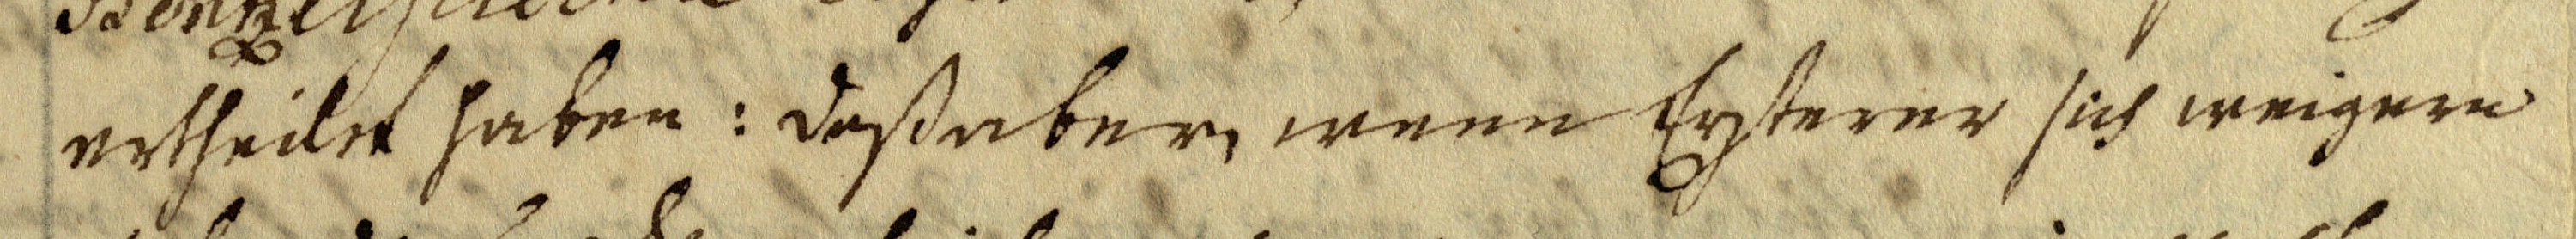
ertheilet haben: daß aber wenn ersterer sich weigern
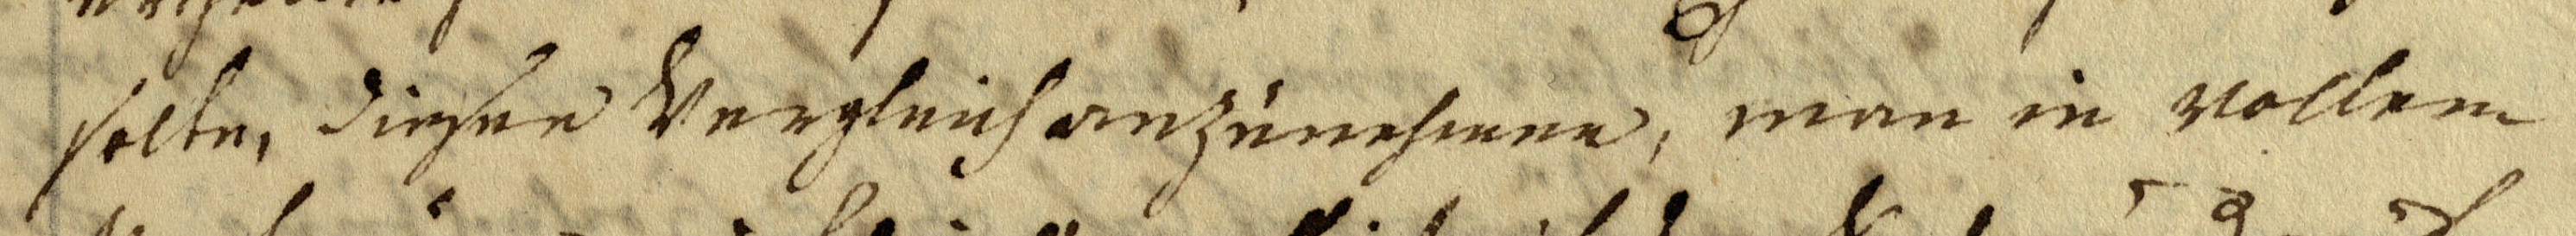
solte, diesen Vergleich anzunehmen, man in vollem
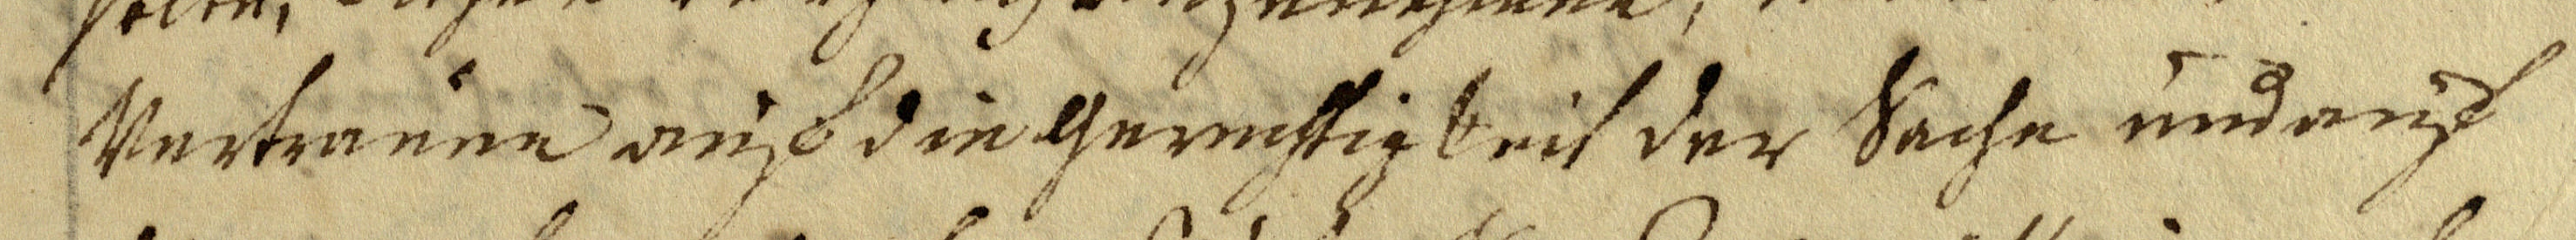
Vertrauen auf die Gerechtigkeit der Sache und auf
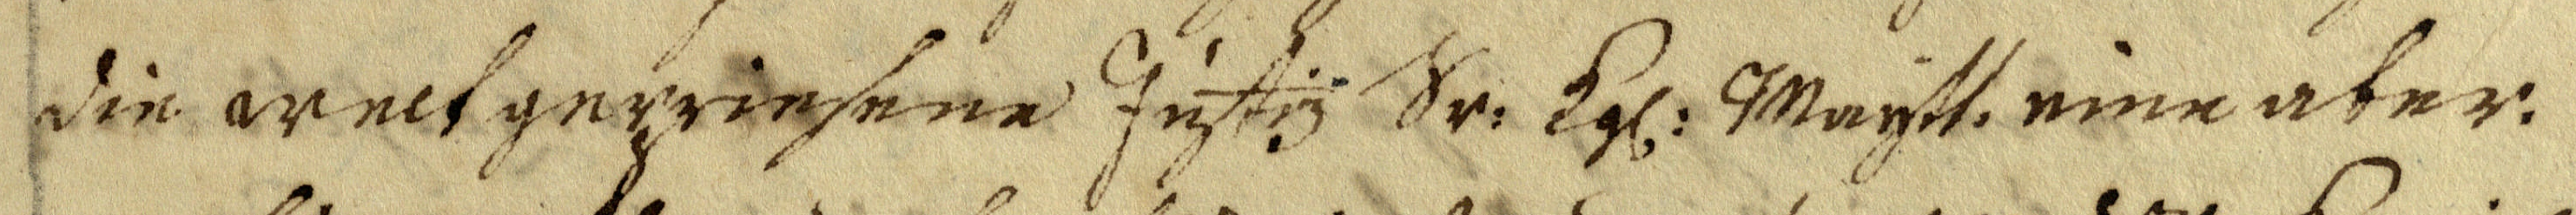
die weit gepriesene Justiz Sr. Maÿtt. eine aber¬
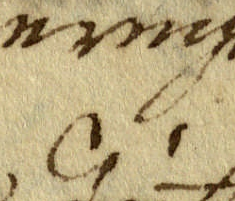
malige allerunterthänigste Vorstellung
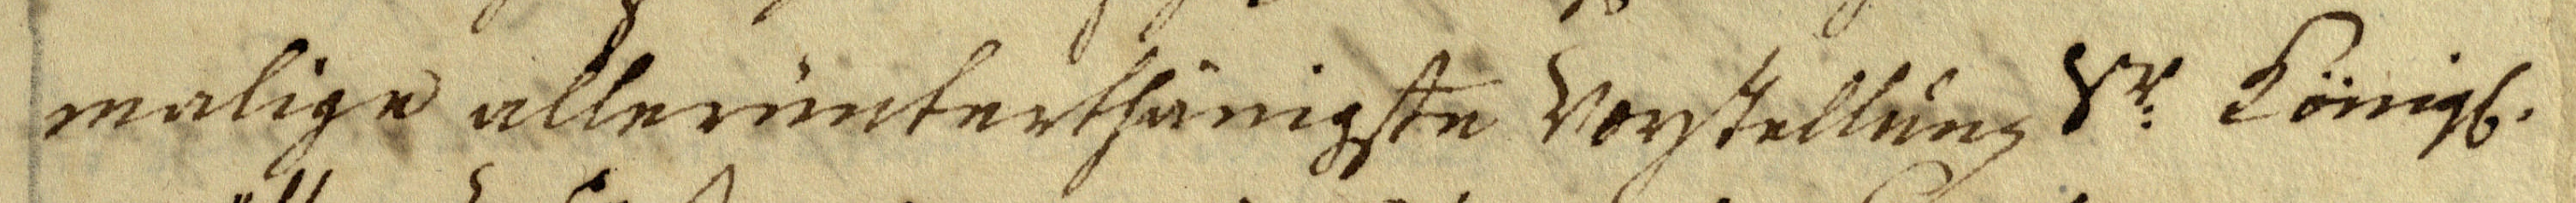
Sr. Königl.
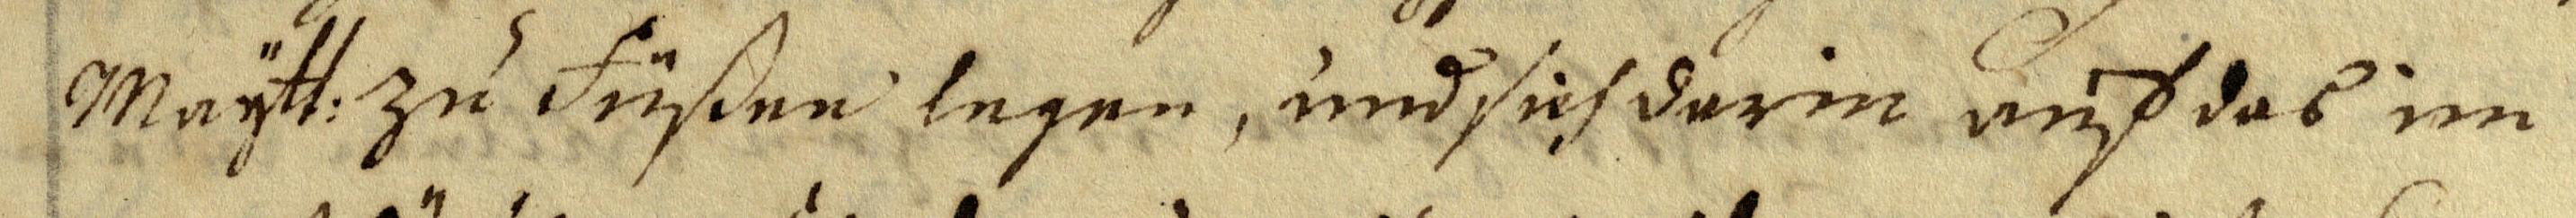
Maÿtt. zu Füßen legen, und sich darin auf das im
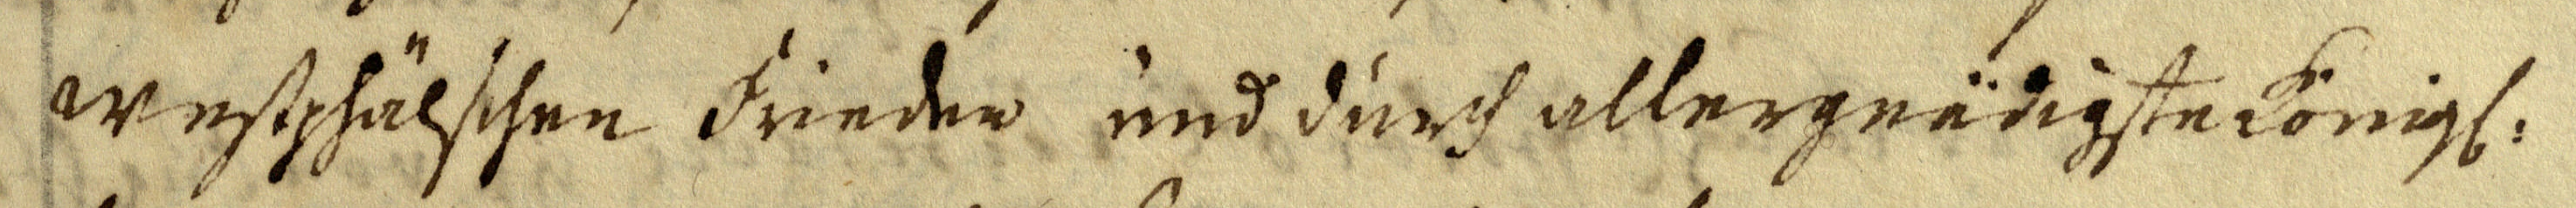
Westphälischen Frieden und durch allergnädigste Königl.
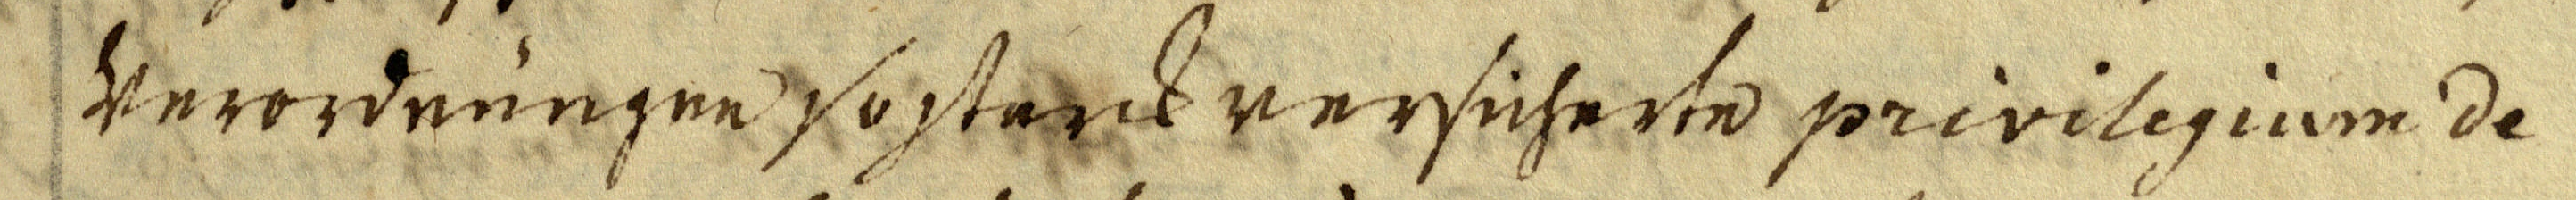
Verordnungen so starck versicherte privilegium de
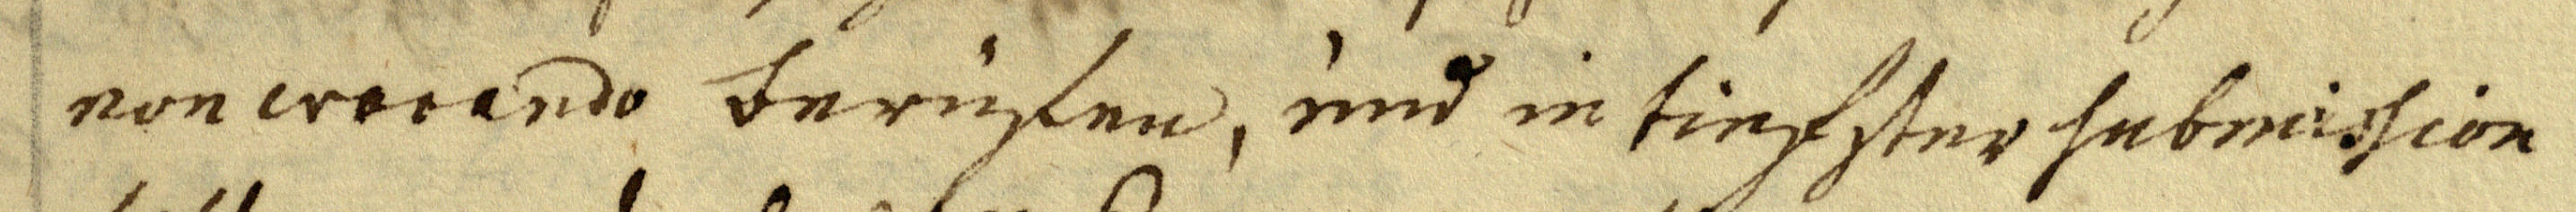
non evocando berufen, und in tiefster submission
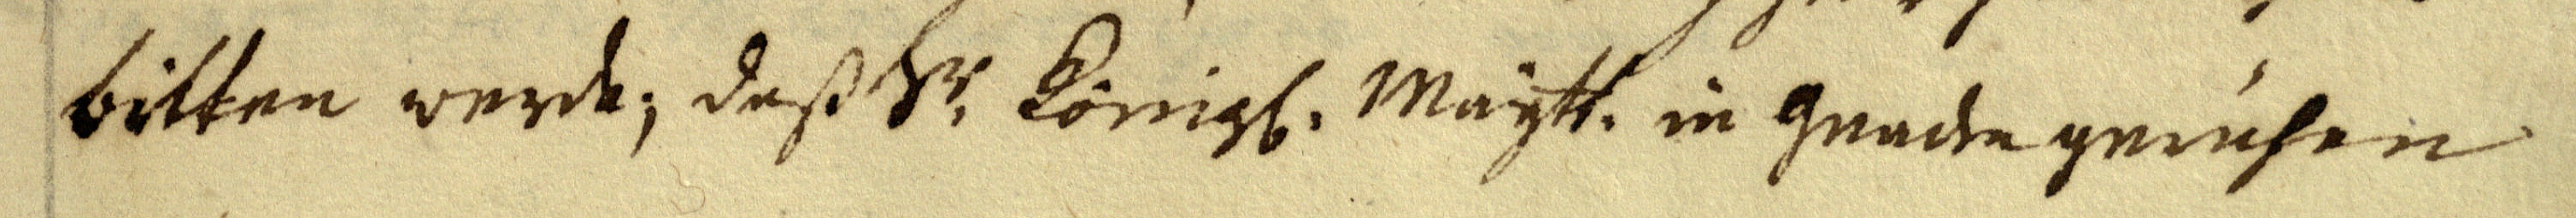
bitten werde, daß Sr Königl. Maÿtt. in Gnaden geruhen
